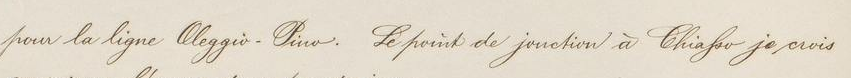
pour la ligne Oleggio–Pino. Le point de jonction à Chiasso je crois
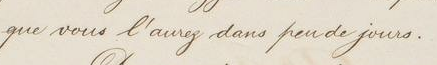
que vous l'aurez dans peu de jours.
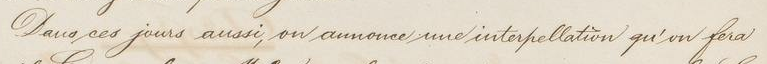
Dans ces jours aussi, on annonce une interpellation qu'on fera
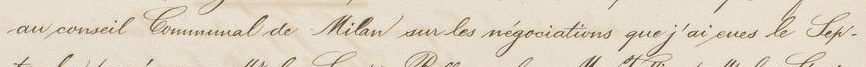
au conseil Communal de Milan sur les négociations que j'ai eues le Sep-
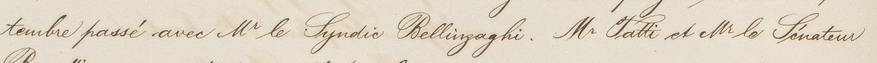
tembre passé avec Mr le Syndic Bellinzaghi. MrTatti et Mr le Sénateur
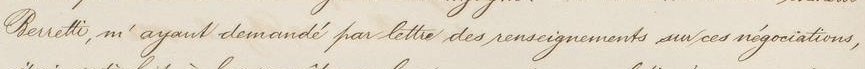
Berretti, m'ayant demandé par lettre des renseignements sur ces négociations,
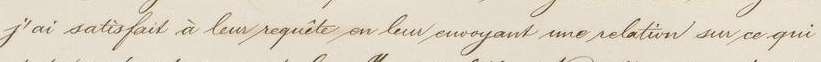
j'ai satisfait à leur requête en leur envoyant une relation sur ce qui
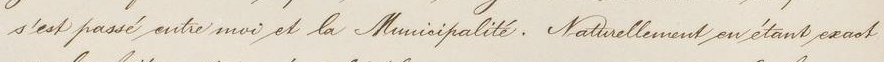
s'est passé entre moi et la Municipalité. Naturellement en étant exact
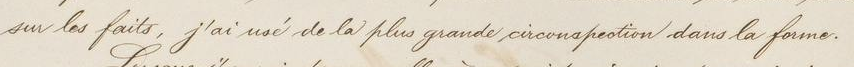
sur les faits, j'ai usé de la plus grande circonspection dans la forme.
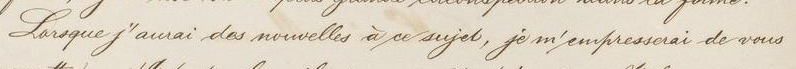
Lorsque j'aurai des nouvelles à ce sujet, je m'empresserai de vous
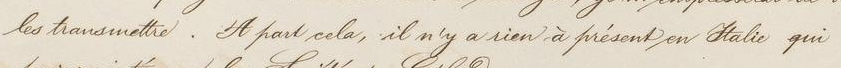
les transmettre. A part cela, il n'y a rien à présent en Italie qui
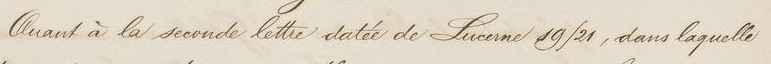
Quant à la seconde lettre datée de Lucerne19/21, dans laquelle
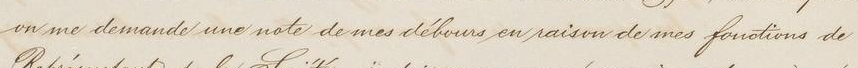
on me demande une note de mes débours en raison de mes fonctions de
